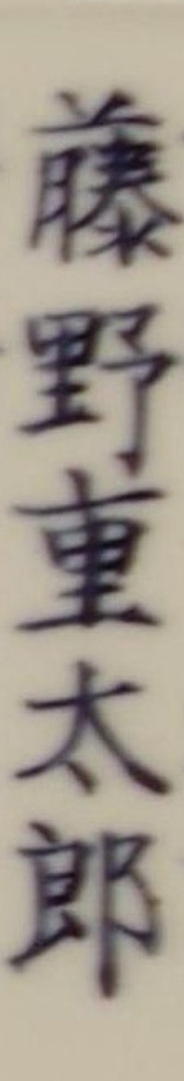藤野重太郎
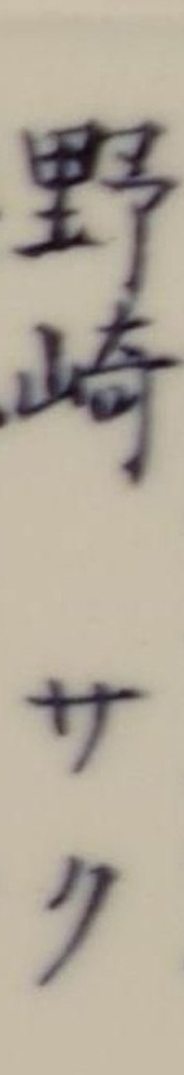野崎サク
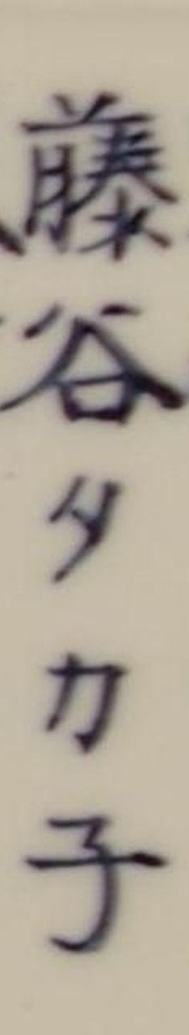藤谷タカ子
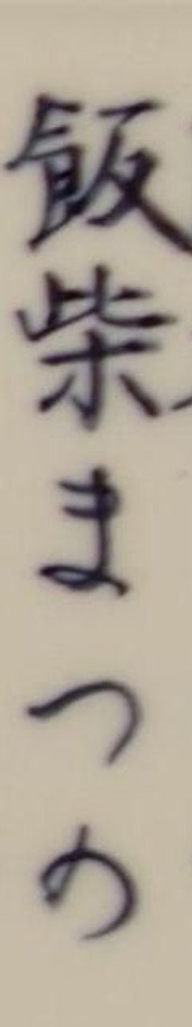飯柴まつの
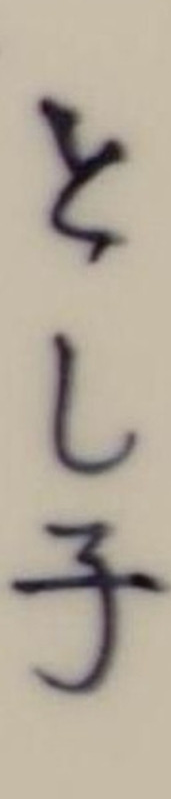とし子
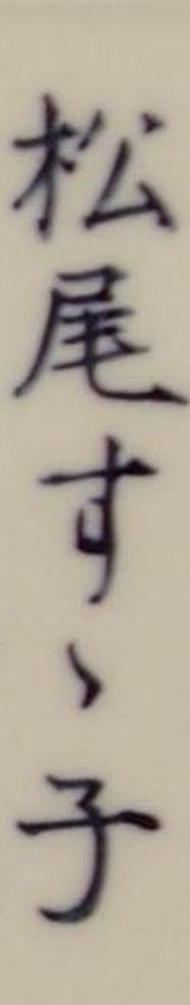松尾すゝ子
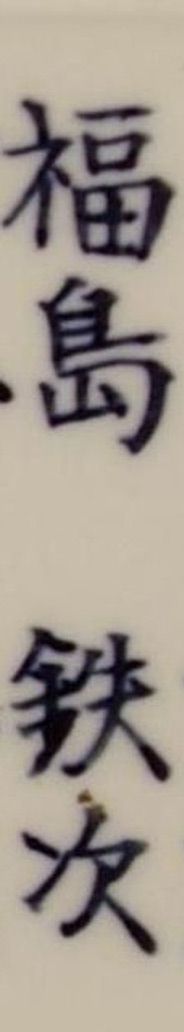福島鉄次
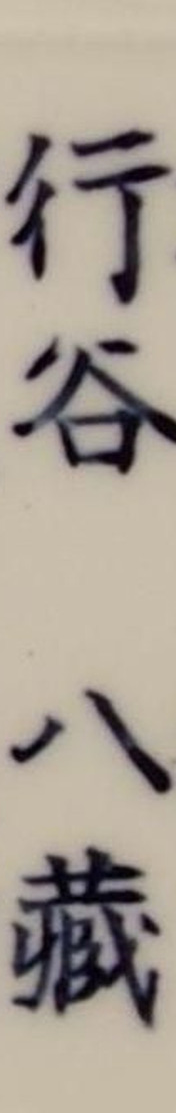行谷八蔵
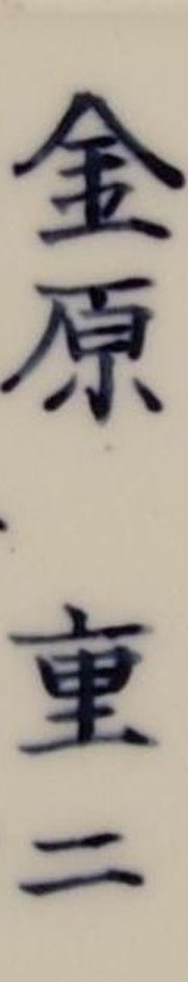金原重二
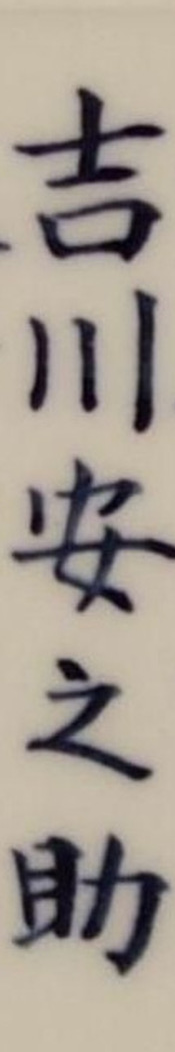吉川安之助
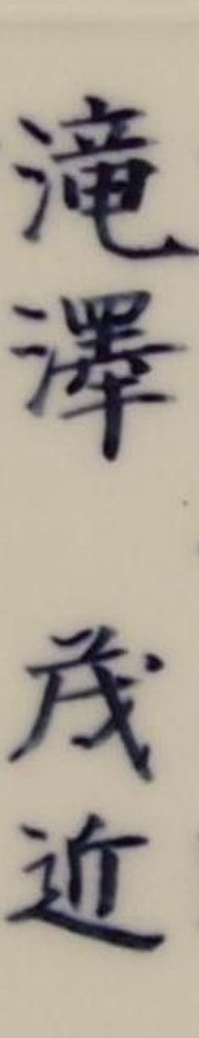滝澤茂近
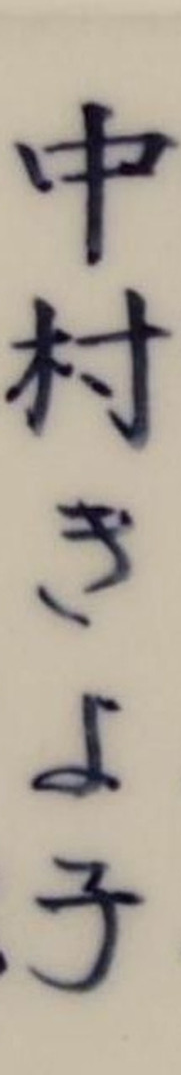中村きよ子
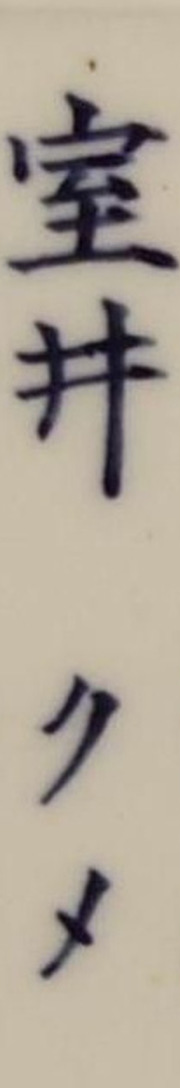室井クメ
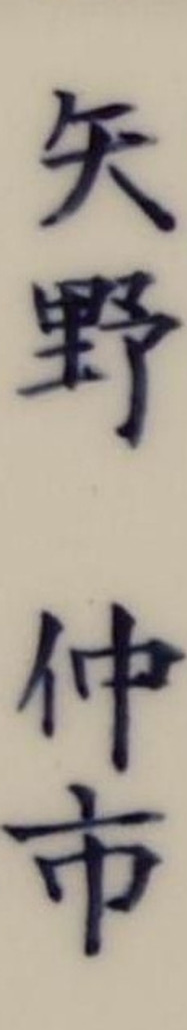矢野仲市
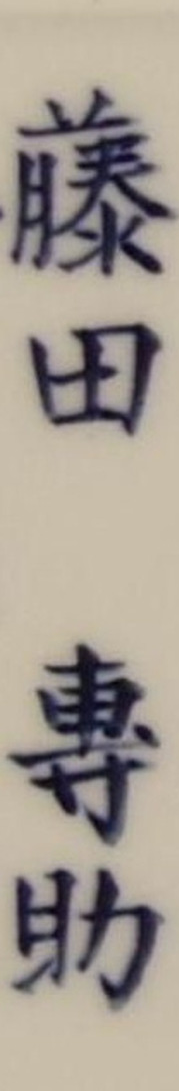藤田専助
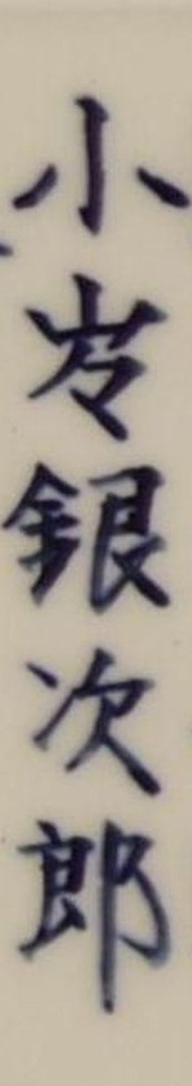小出銀次郎
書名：E~L
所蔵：高野山金剛峯寺
